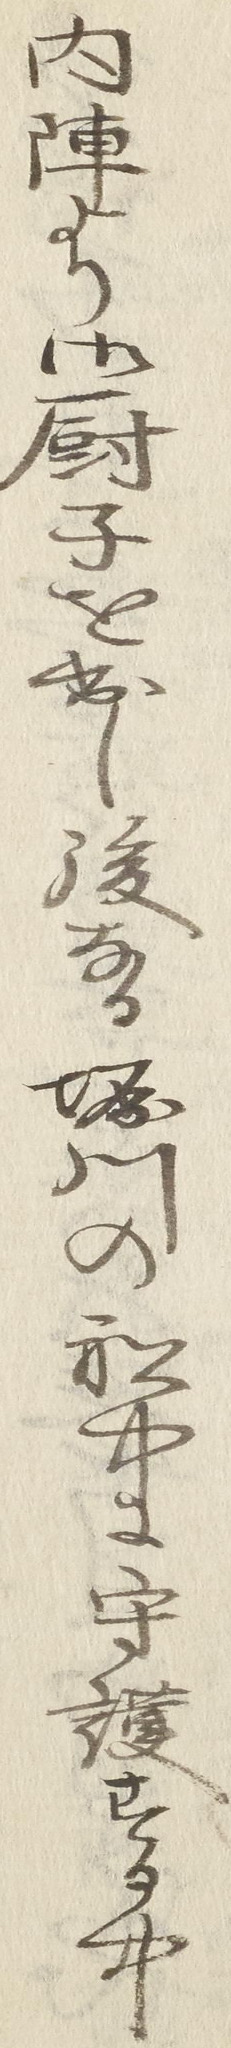内陣より御厨子を出し後なる堀川の船中に守護する中
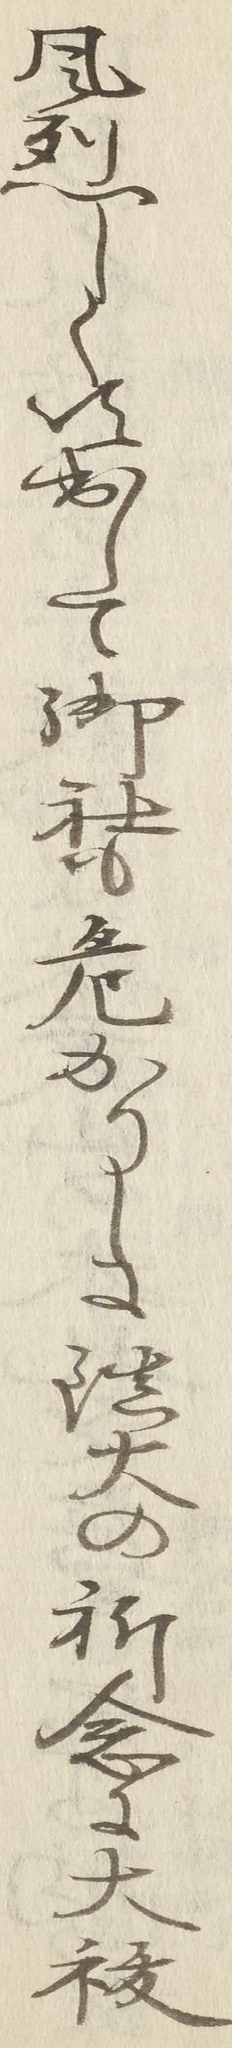風烈しく吹出して御社も危かりしに鎮火の祈念におお祓
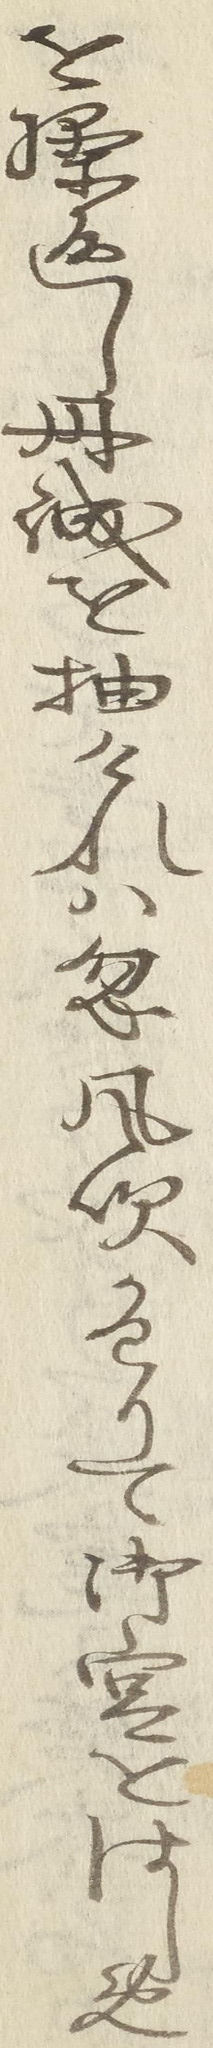を繰返し丹誠を抽けれは忽風吹かわりて御宮をはしめ
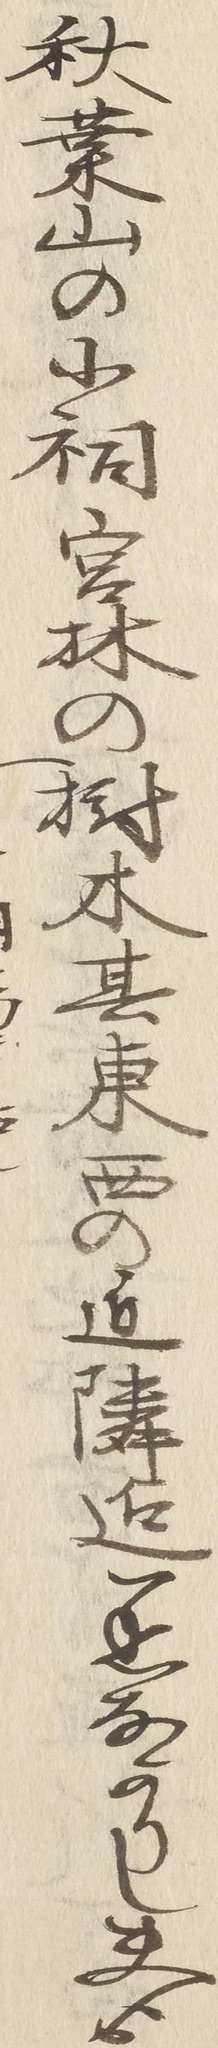秋葉山の小祠宮林の樹木其東西の近隣迄恙なかりし夫より
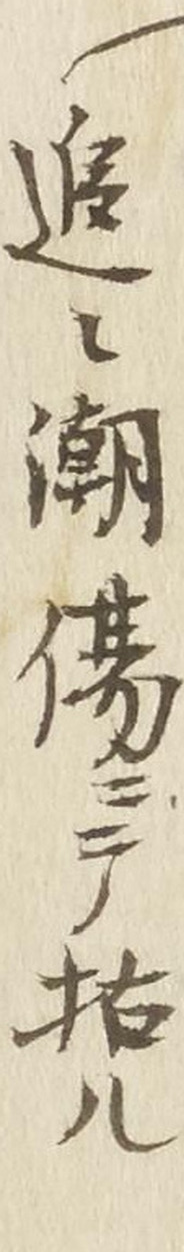追々潮場にて枯る

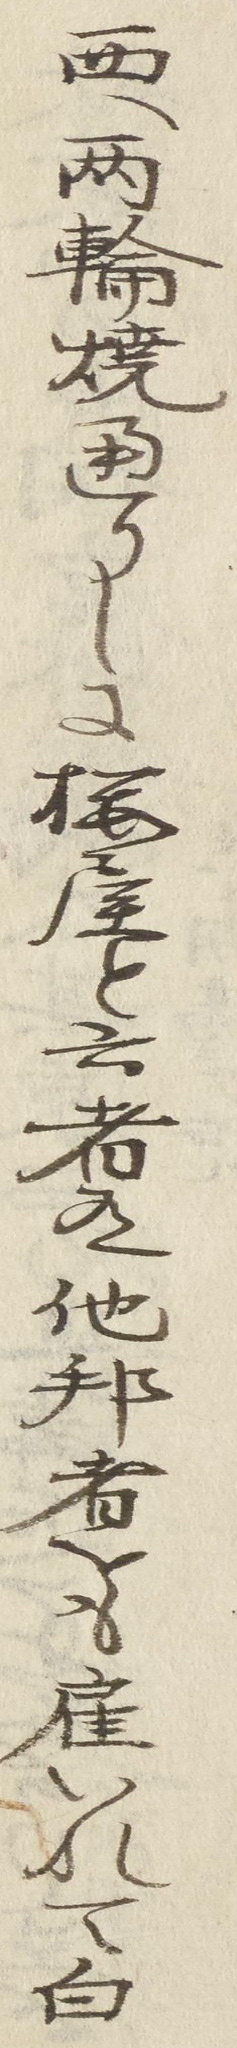西へ両輪焼通りしに桜屋と云者有他邦者をも雇いれて白
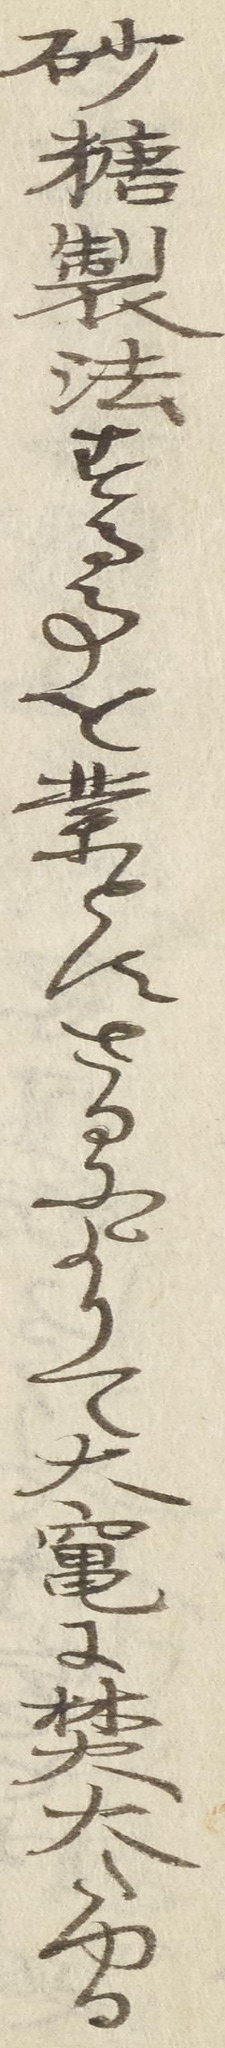砂糖製法する事を業とすさるによりて大震に焚火たゆる
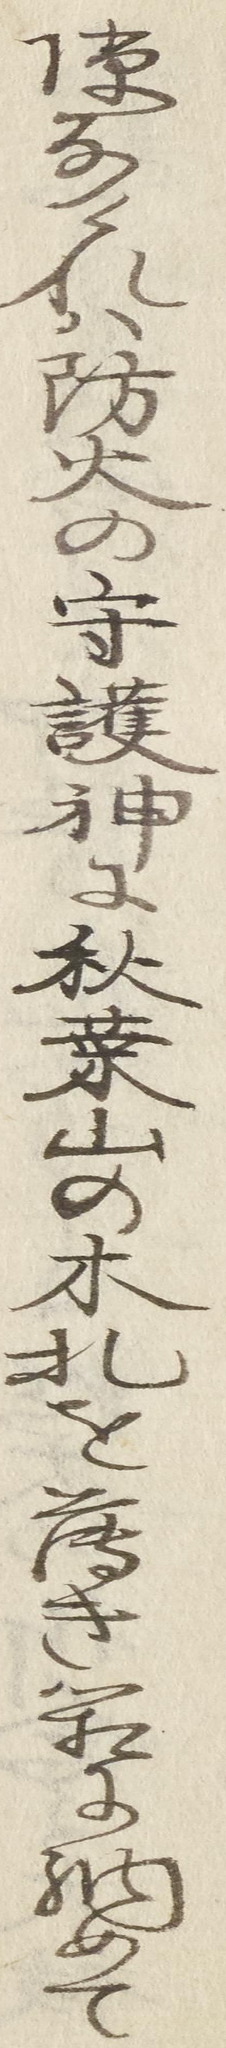隙なけれは防火の守護神に秋葉山の木札を薄き箱に納めて
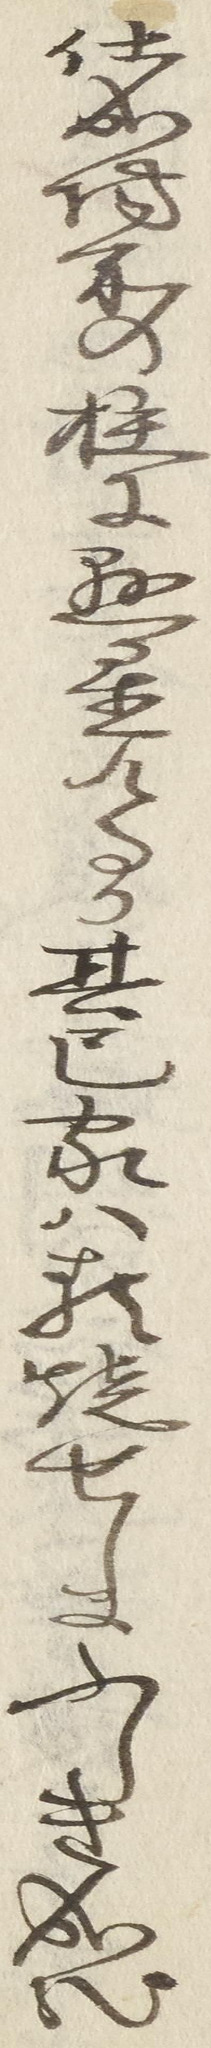仕成場所の柱に懸置けるか其己家は類焼せしにふしき成哉
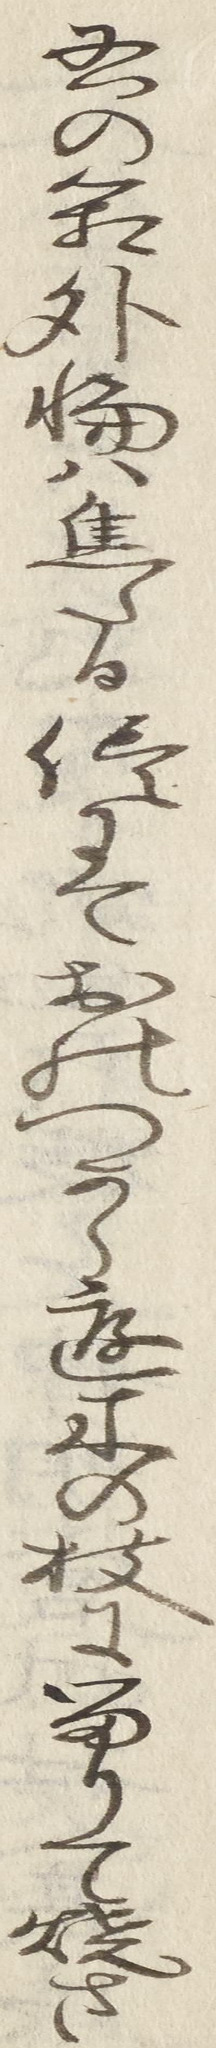右の箱外輪は焦たる儘にておのつから庭木の枝に留りて焼さ
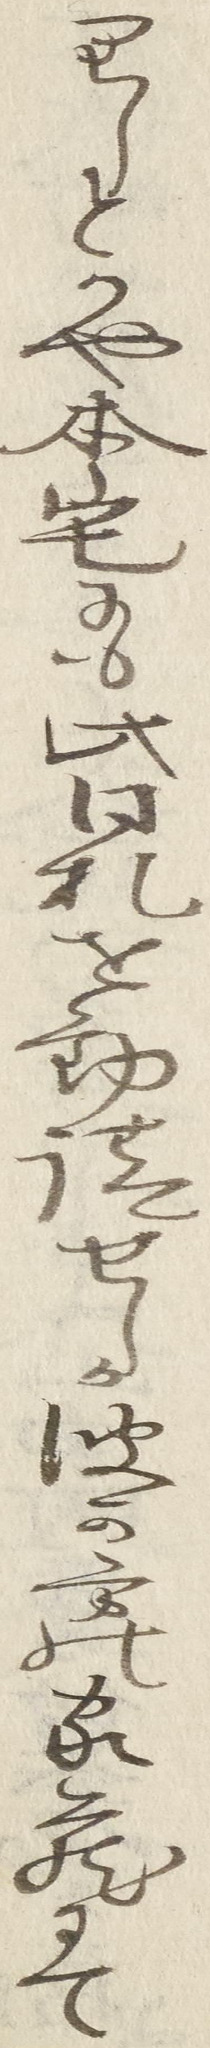りしとかや本宅にも此同札を勧請せしか彼か方の家蔵にて
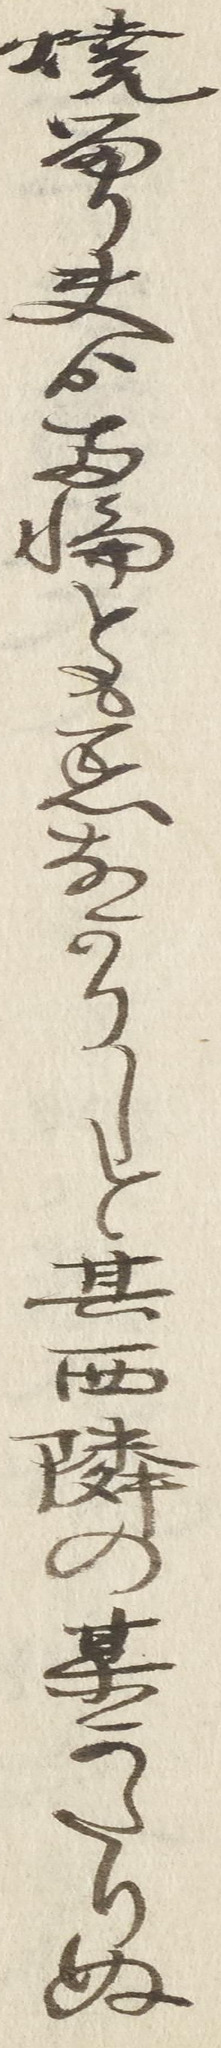焼留り夫ゟ両輪とも恙なかりしと其西隣の某かたりぬ
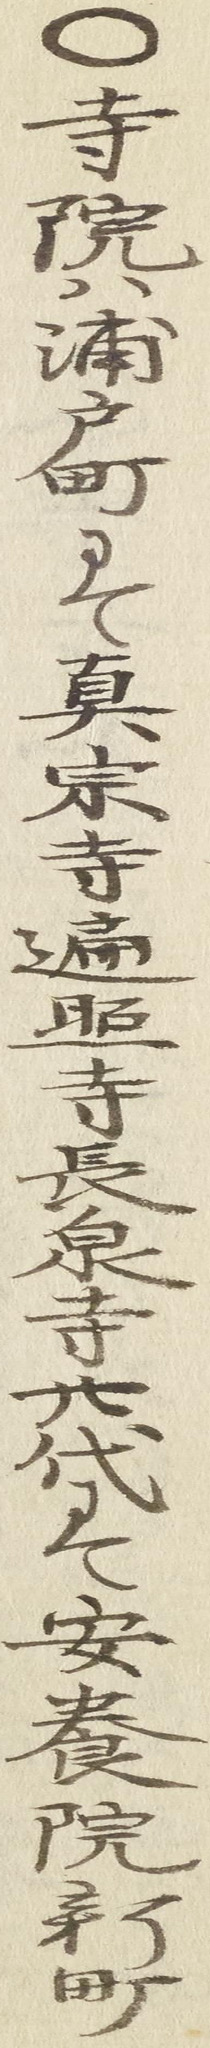〇寺院は浦戸町にて真宗寺遍照寺長泉寺廿代にて安養院新町
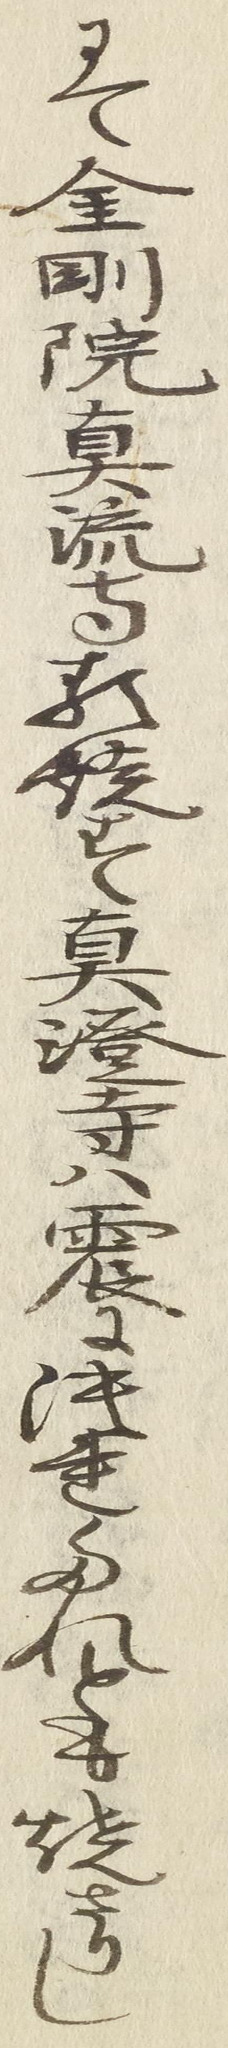にて金剛院真流寺類焼す真澄寺は震に潰れたれとも焼さりし
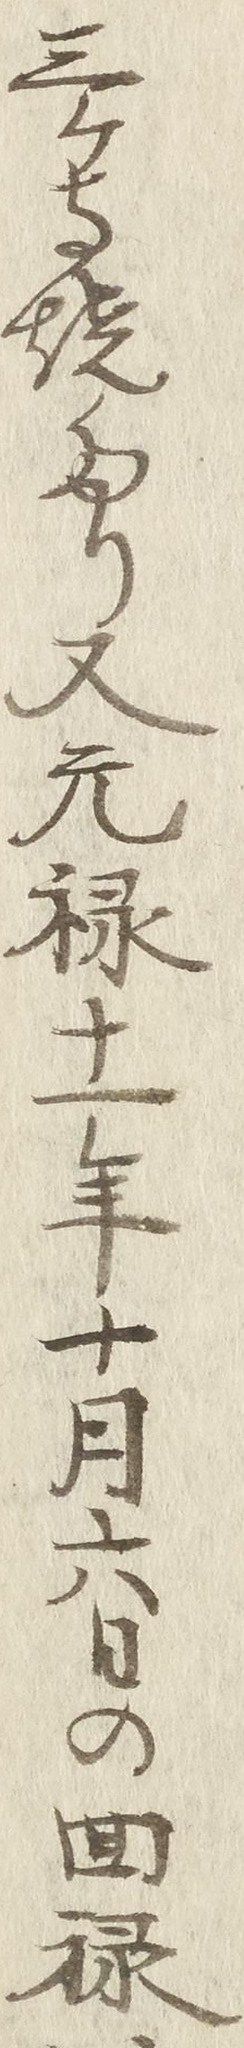三ケ寺焼たり又元禄十一年十月六日の
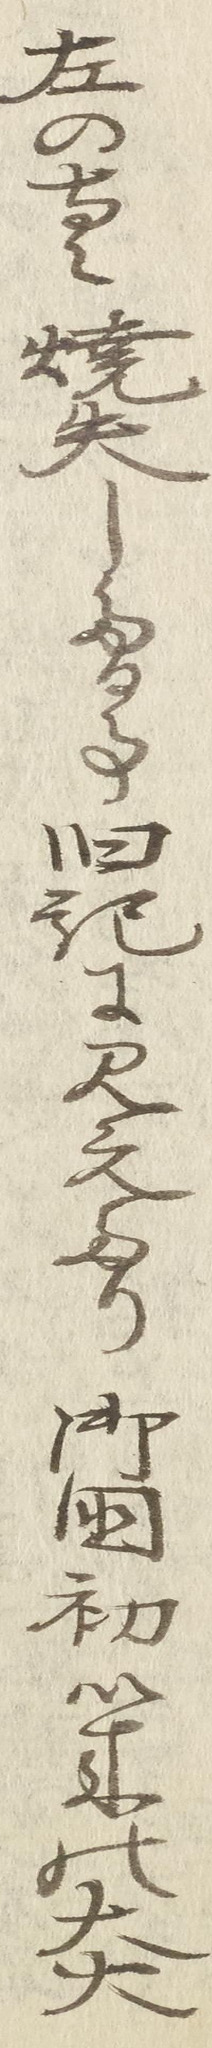左の寺々焼失したる事旧記に見えたり御国初以来の大火
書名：地震記　上
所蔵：東京大学地震研究所図書室 Earthquake Research Institute Library, The University of Tokyo, JAPAN
